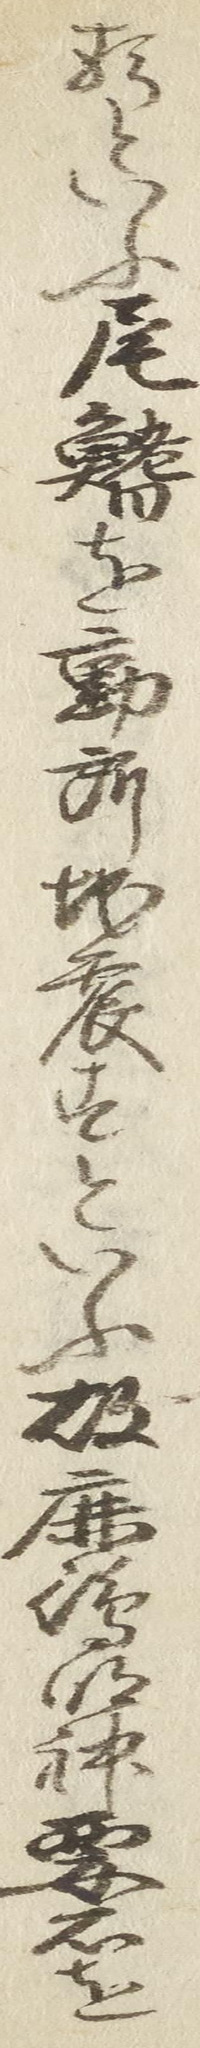るといふ尾鰭を動所地震すといふ廉嶋明神要石を
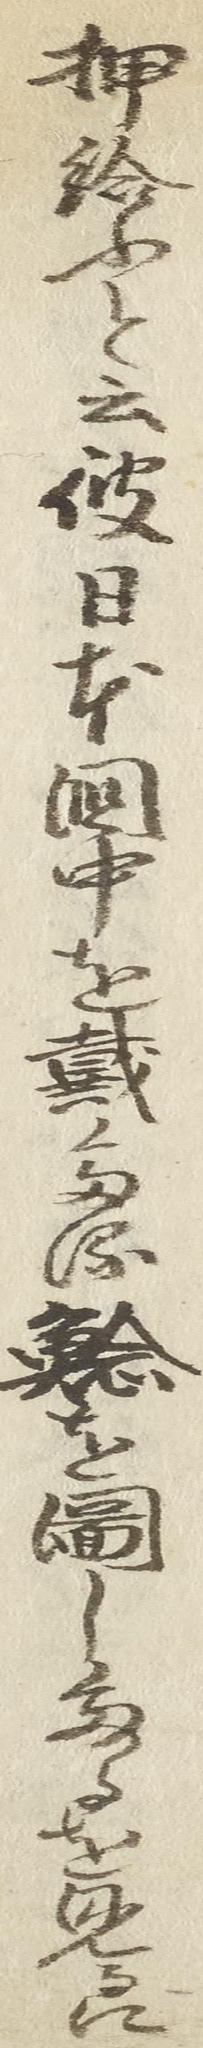押給ふと云彼に本国中を戴たる鯰を圖したるを見るに
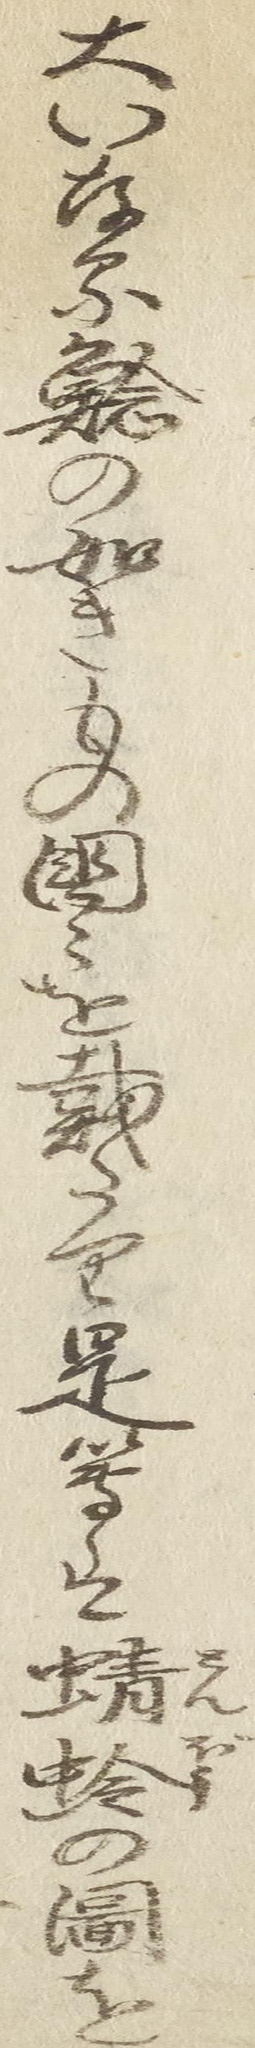大いなる鯰の如きもの国々を戴たり是等は蜻蛉の図を

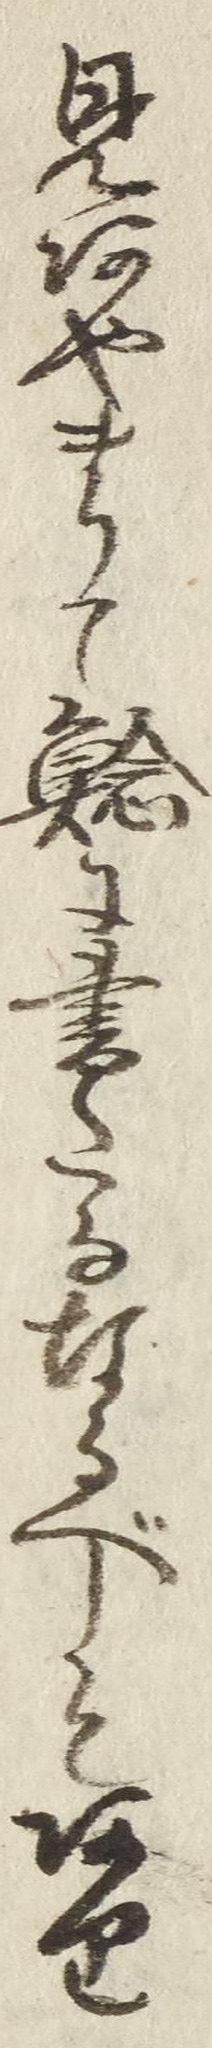見あやまりて鯰に書たるなるべしとあり
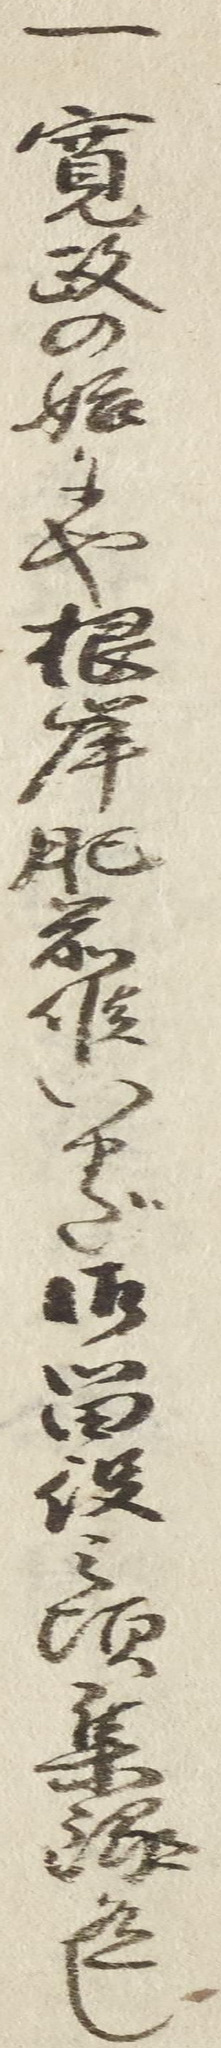一寛政の始にや根岸肥前侯いまだ御留役之頃集縁有し
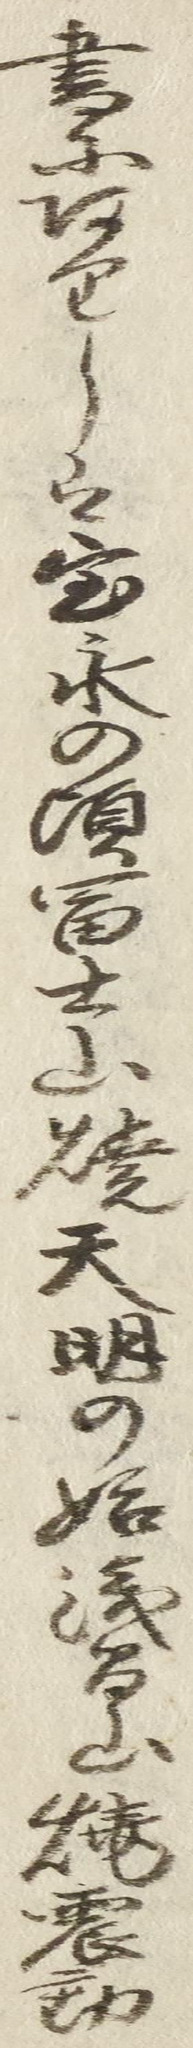書にありしは宝永の頃冨士山焼天明の始浅間山焼震動
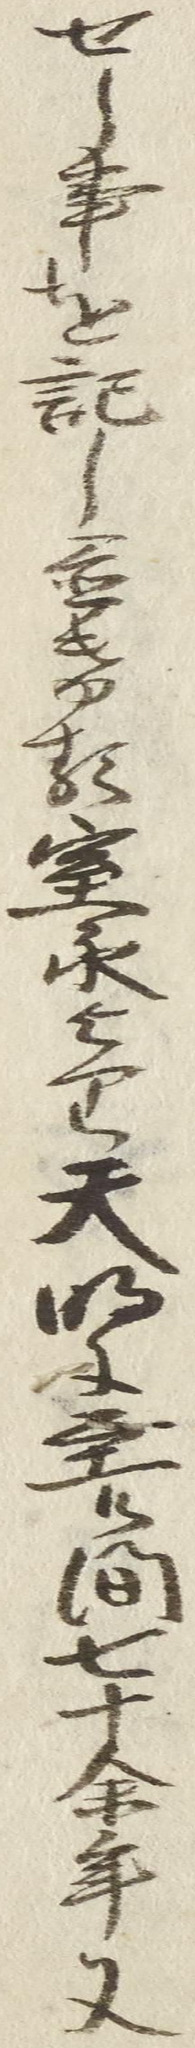せし事を記し置ける宝永より天明に至る間七十余年又
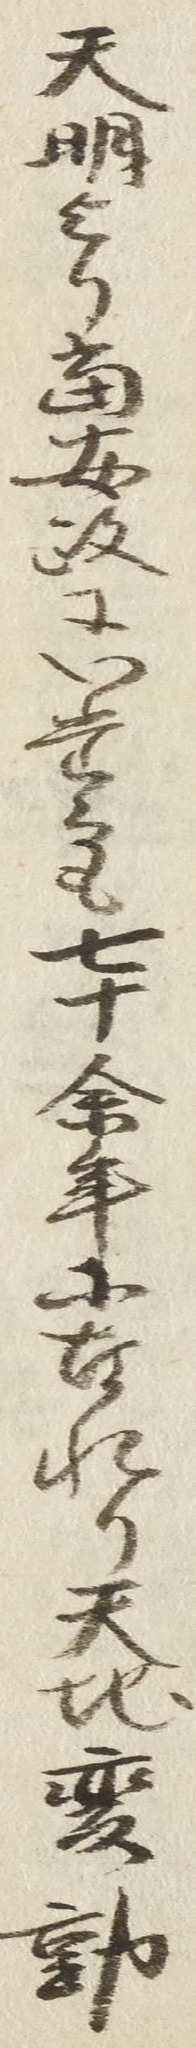天明より当安政にいたるも七十余年になれり天地変動
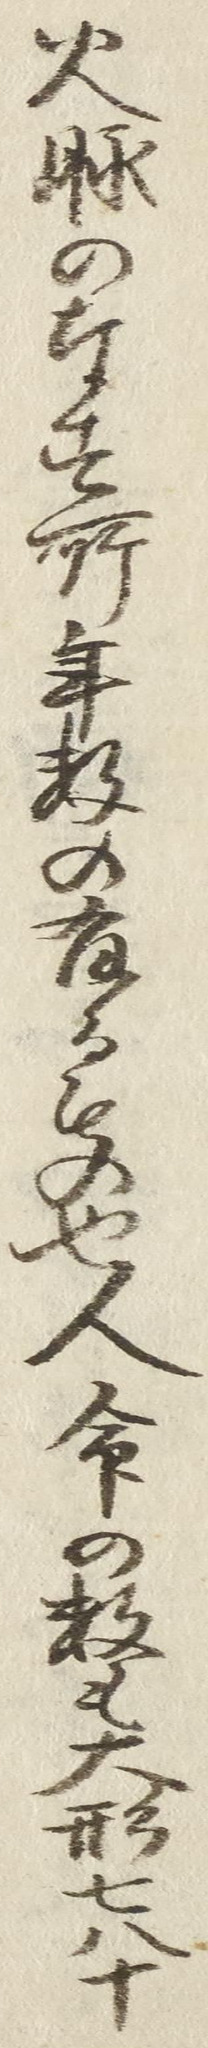火脈のなす所年数の有るもの也人命の数も大形七八十
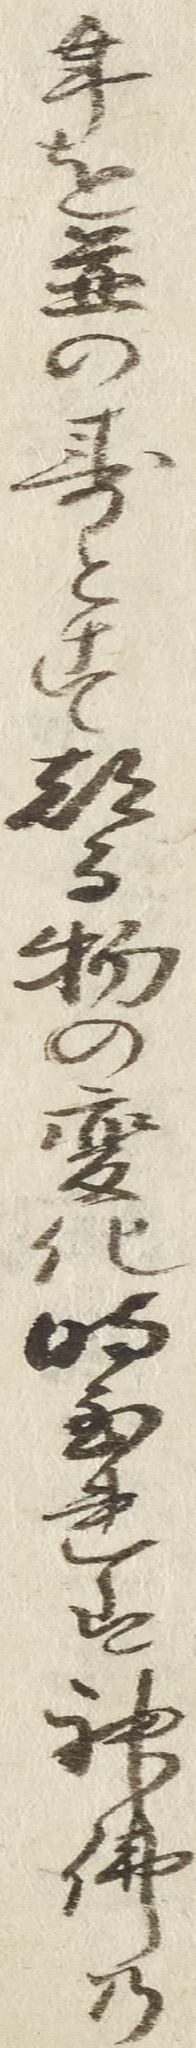年を並の寿とす都而物の変化時たれは神仏の
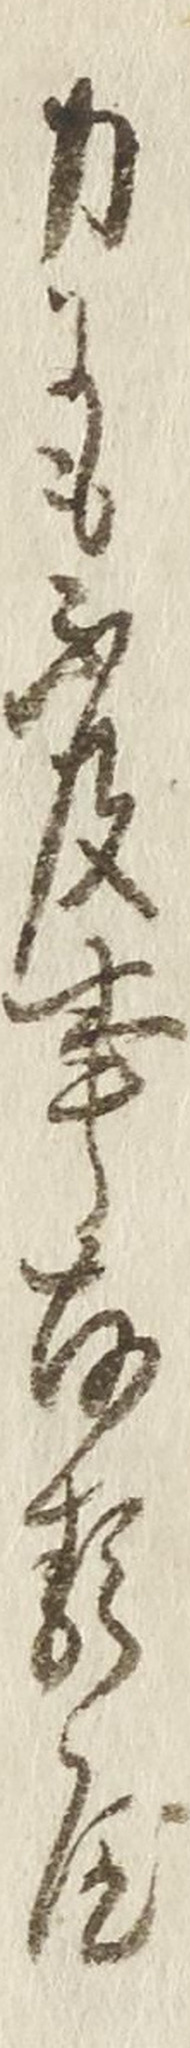力にも不及事なるや
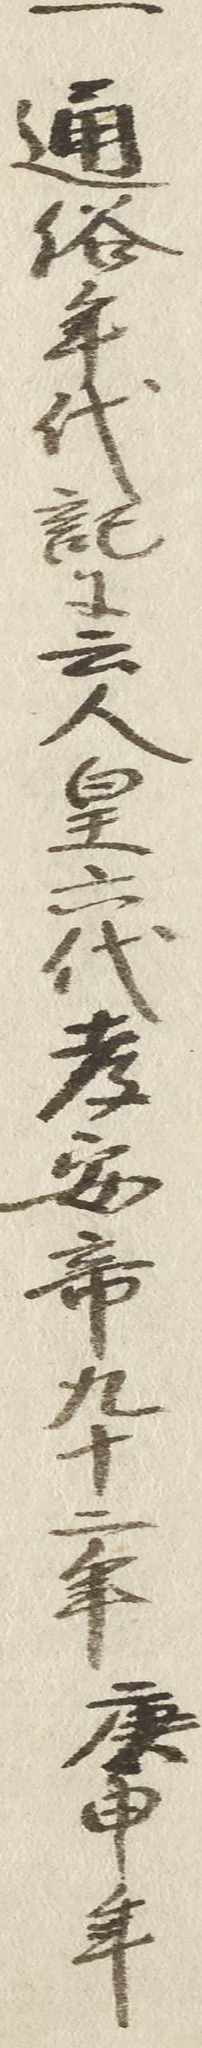一通俗年代記に云人皇六代孝安帝九十二年庚申
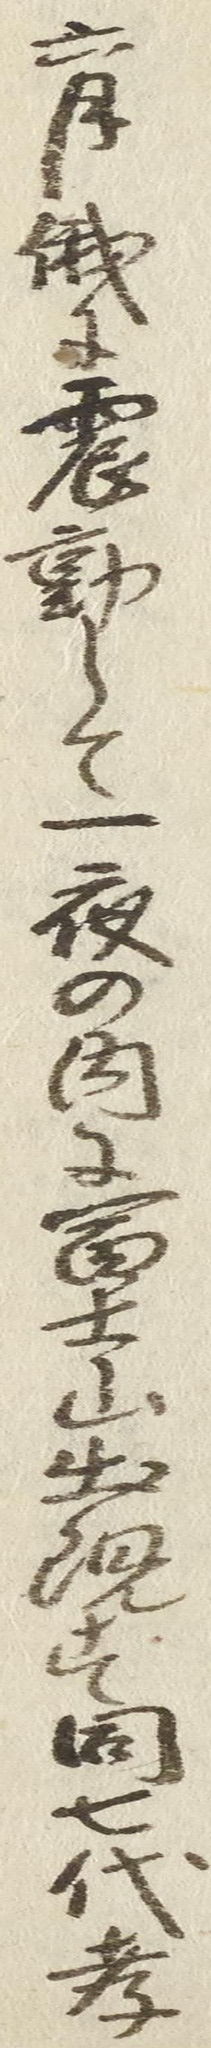年六月俄に震動して一夜の内に冨士山出現す同七代孝
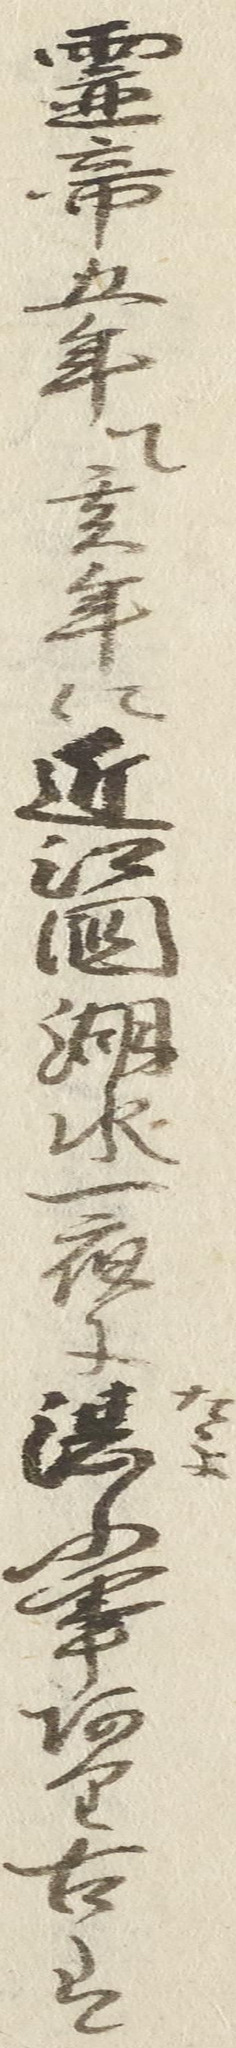靈帝五年乙亥年に近江国湖水一夜に湛ふ事あり古は
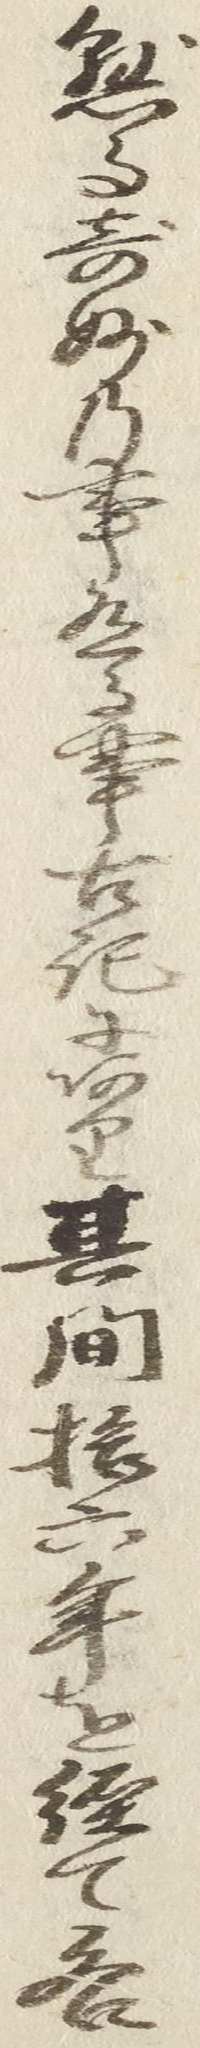然る奇妙の事有る事古記にあり其間六年を経ては
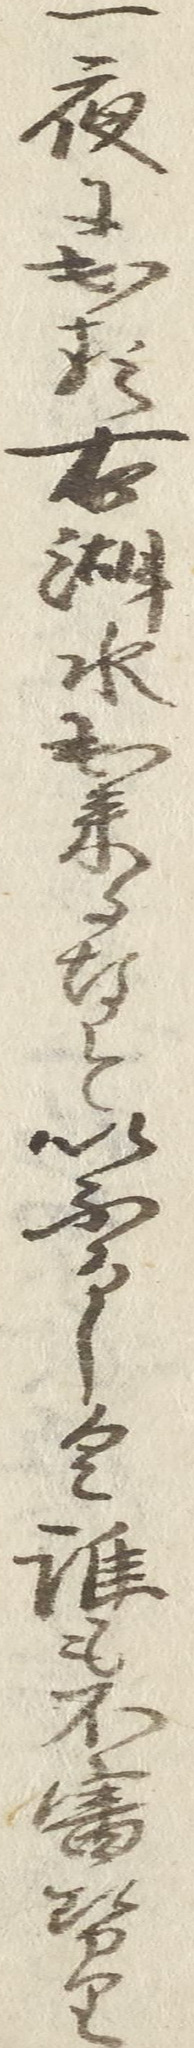一夜に出る古湖水出来るなといふるしは誰も不審なり
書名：従往古地震御届書記誌之一
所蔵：東京大学地震研究所図書室 Earthquake Research Institute Library, The University of Tokyo, JAPAN
